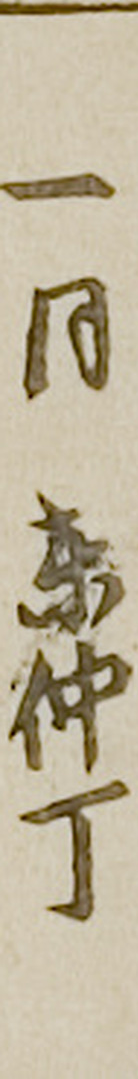一同東仲丁
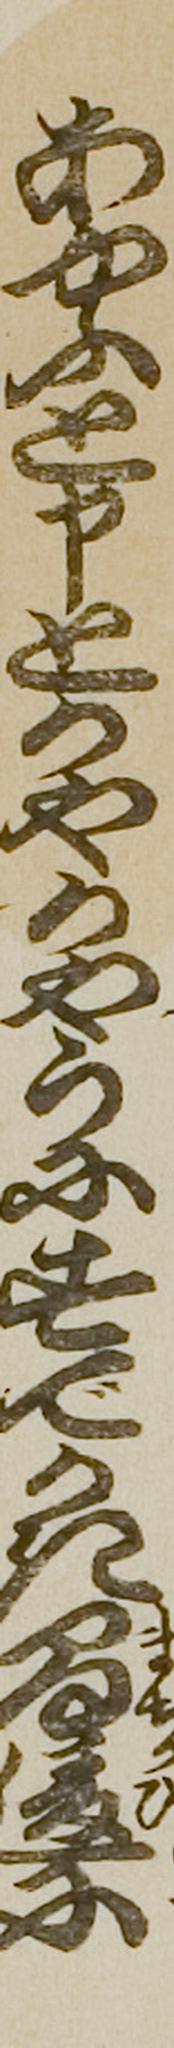あやふと申とかやかやうにすでかき間違に
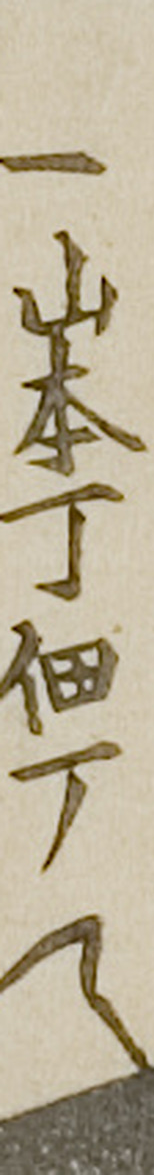一山本丁佃丁
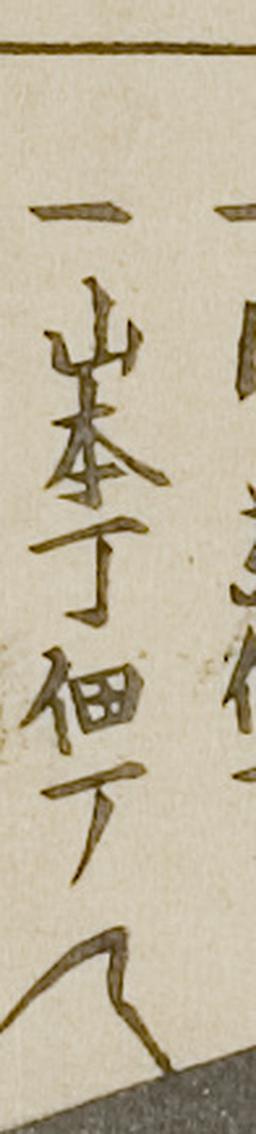一山本丁佃丁
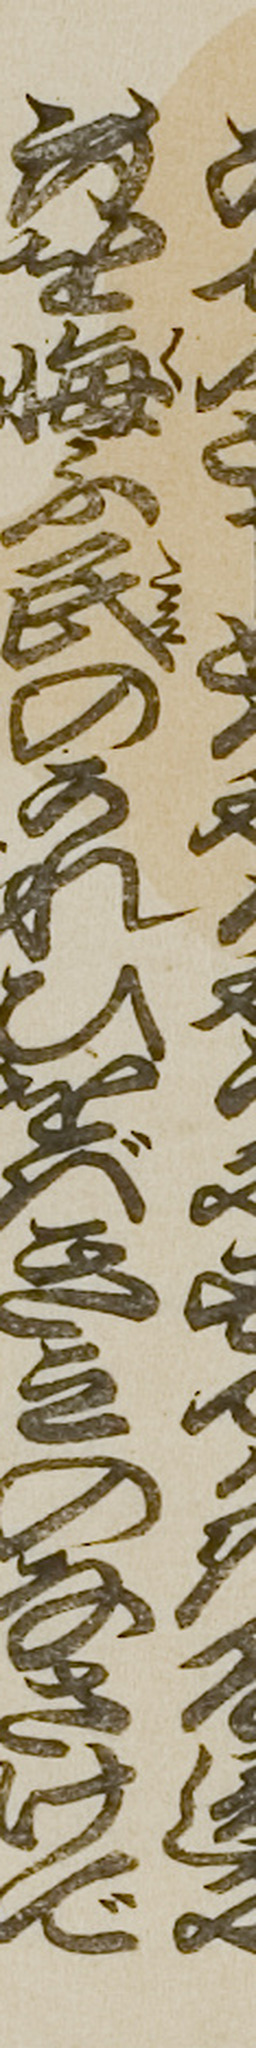身を悔ふ民のうれひをバきミのなさけで
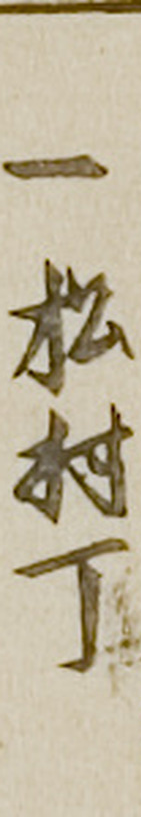一松村丁
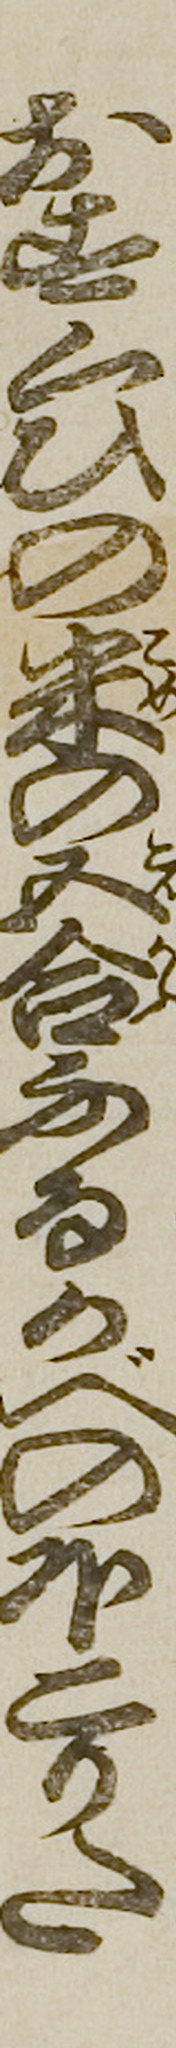おすくひの米の五合ふるかべのほこりた
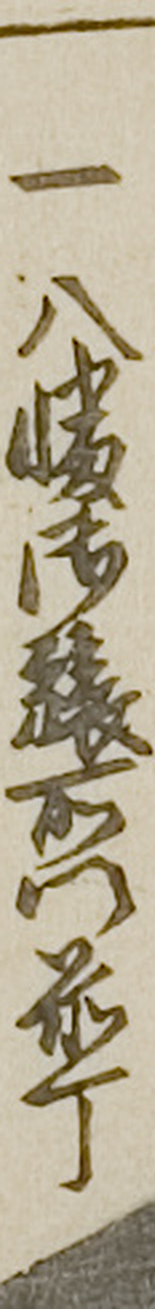一八幡御旅所門前丁
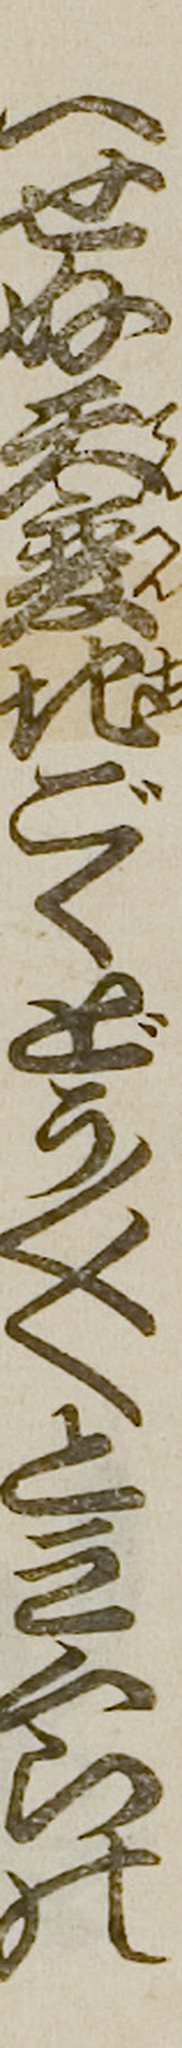へせぬ転変地ごくどう〳〵〳〵とミくらの
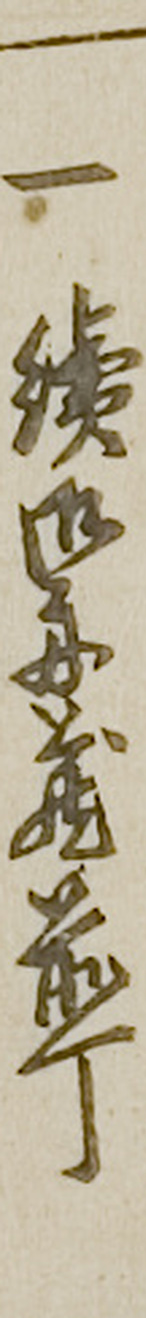一続御舟蔵前丁
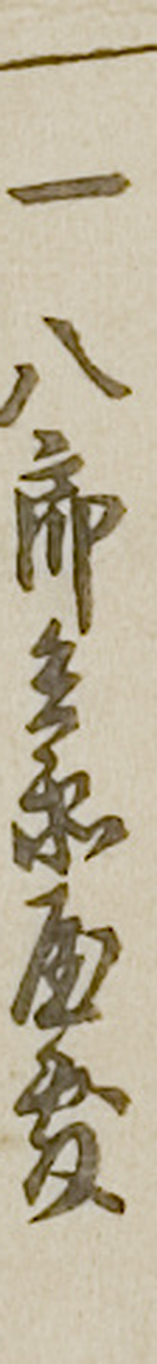一八郎兵衛屋敷
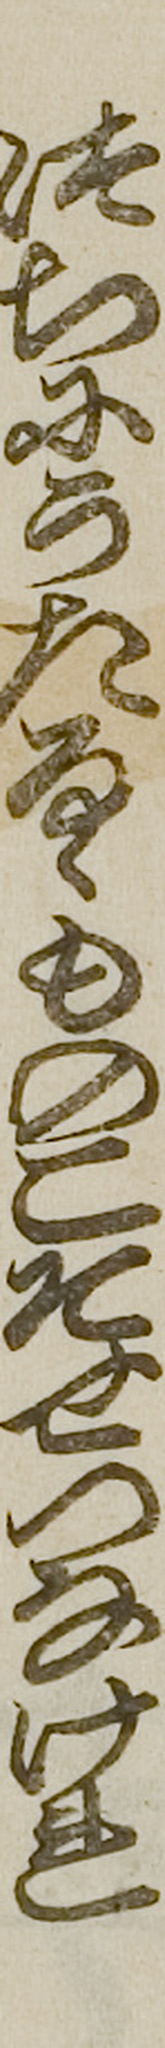つちにうたるゝものこそせつなけれ
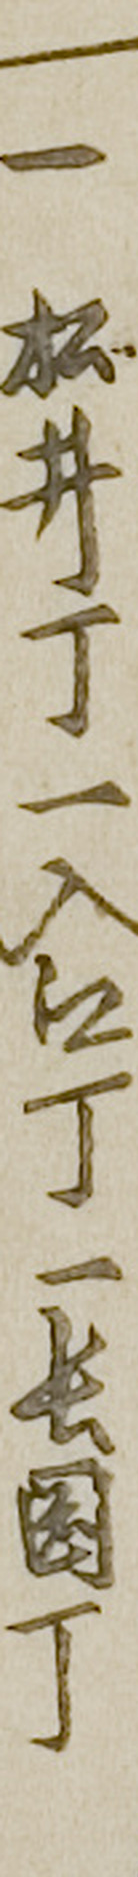一松井丁一入江町一長園丁
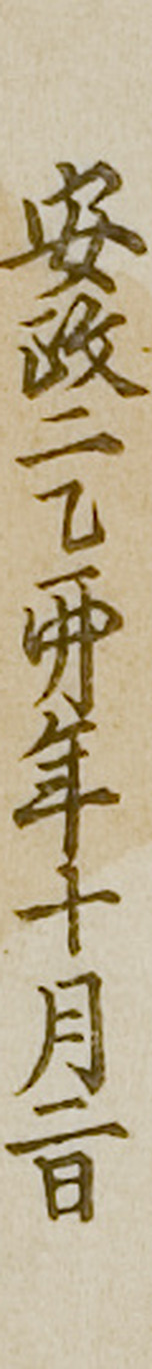安政二乙卯年十月二日
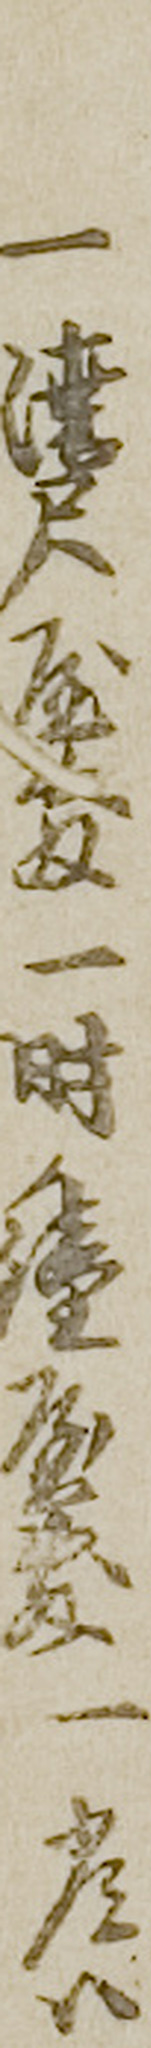一陸尺屋敷一時ノ鐘屋敷一常ハ丁
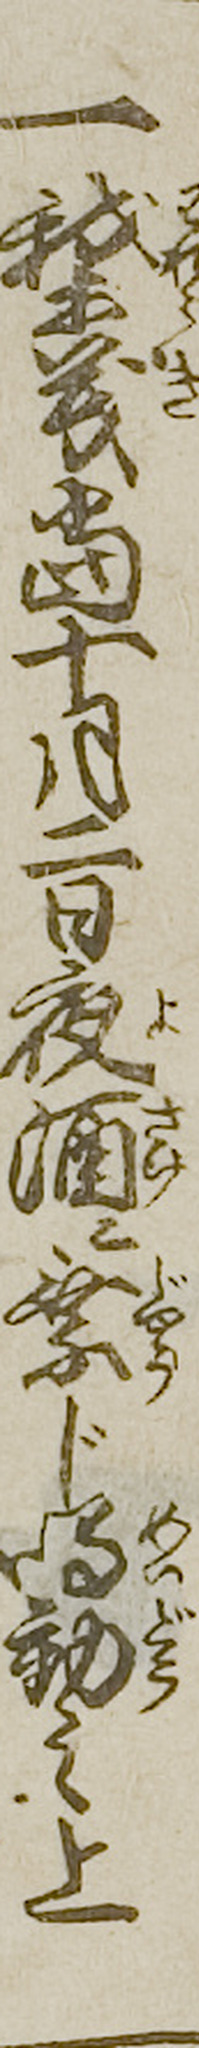我等義当十月二日夜酒二乗じ鳴動之上
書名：老まづ
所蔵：東京大学総合図書館 General Library in the University of Tokyo, JAPAN
